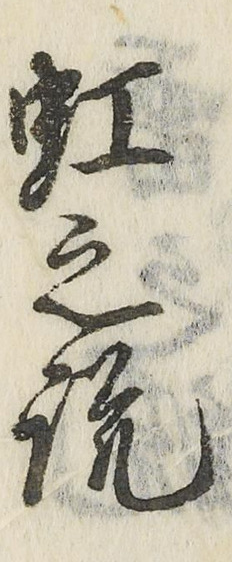雷之説
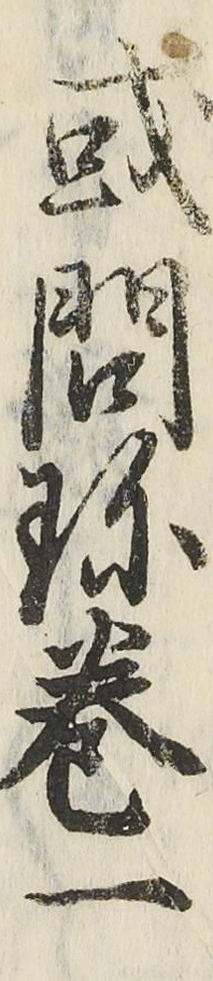或問珍巻一
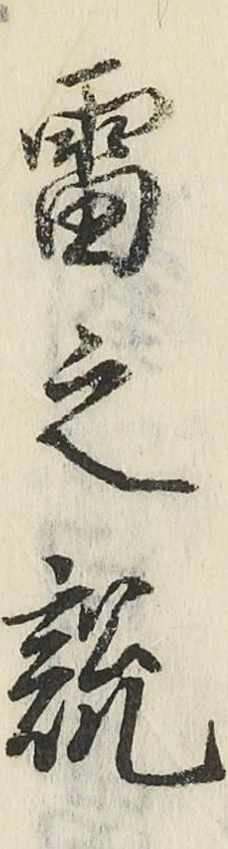雷之説
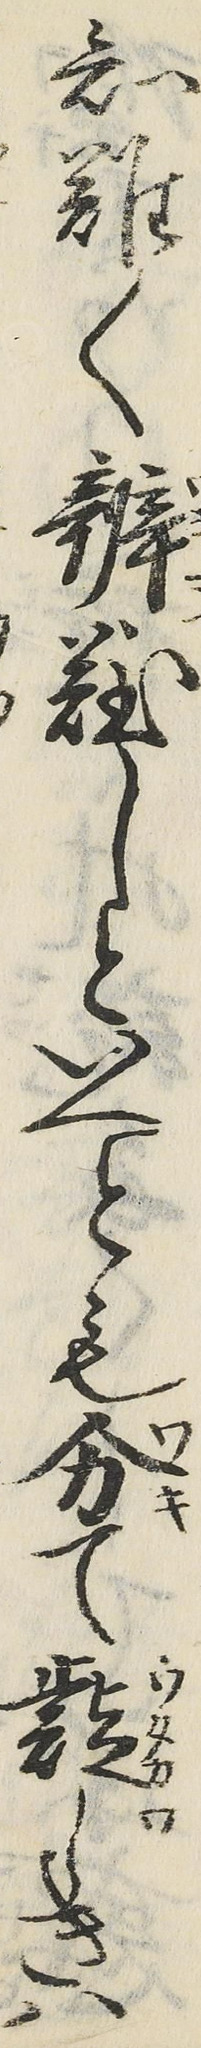知難く弁難しといへとも分て疑しきは
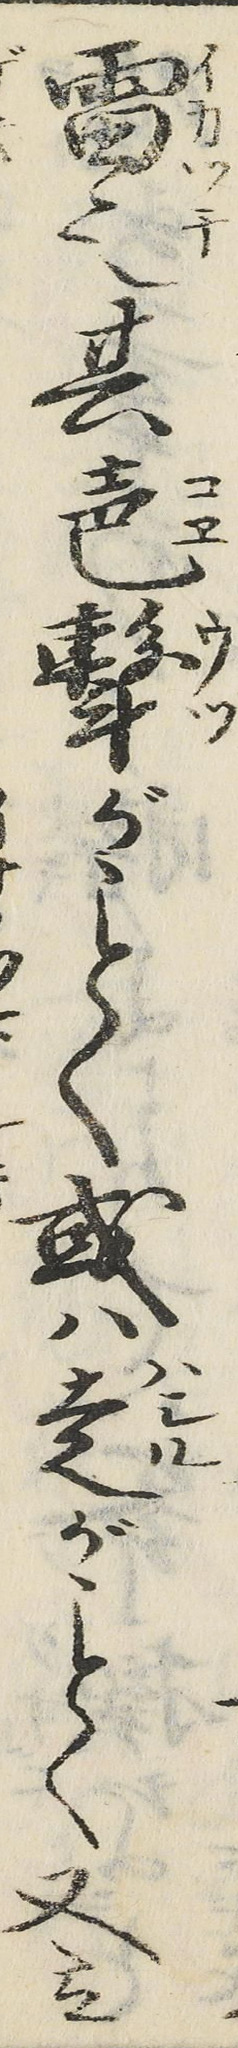雷也其声撃がことく或は走がことく又は
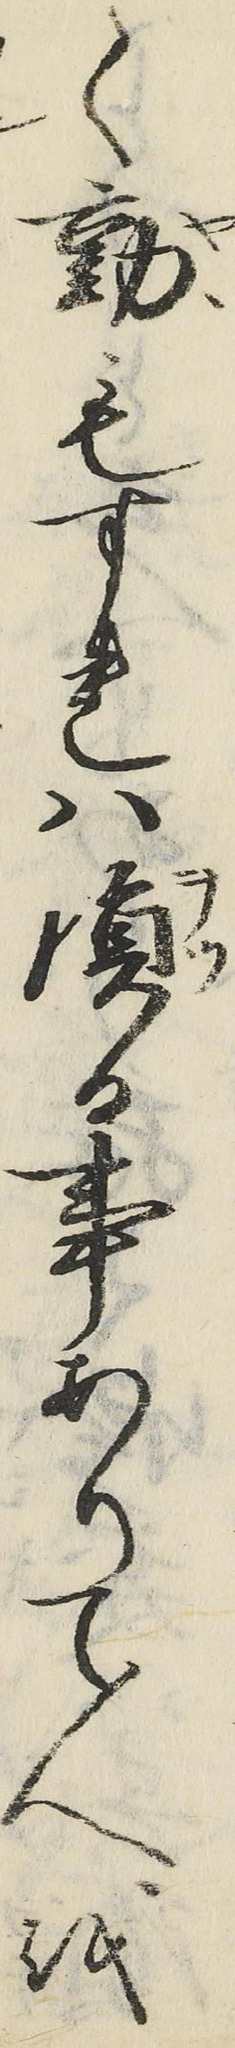く動もすれは隕る事ありて人を
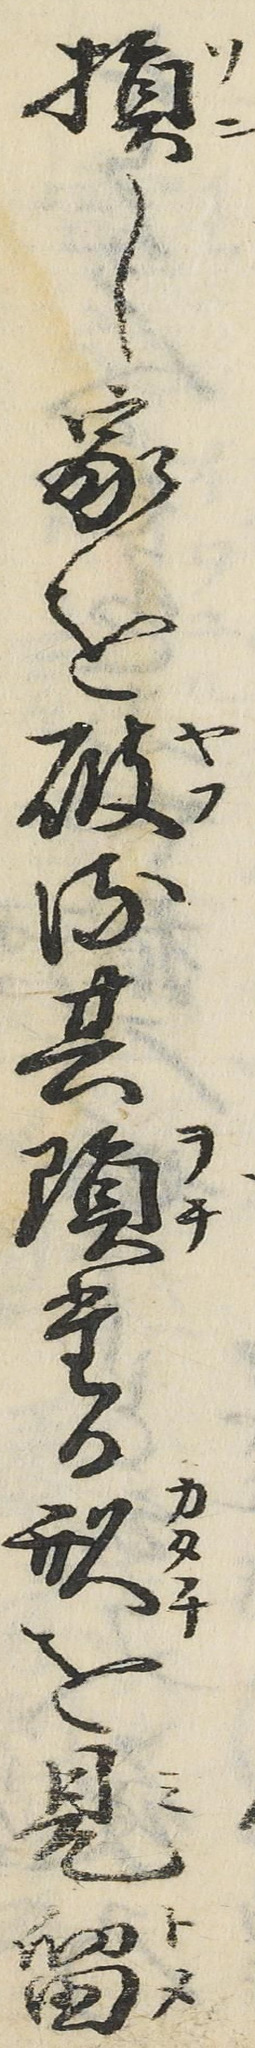損し家を破る其隕たる形を見留

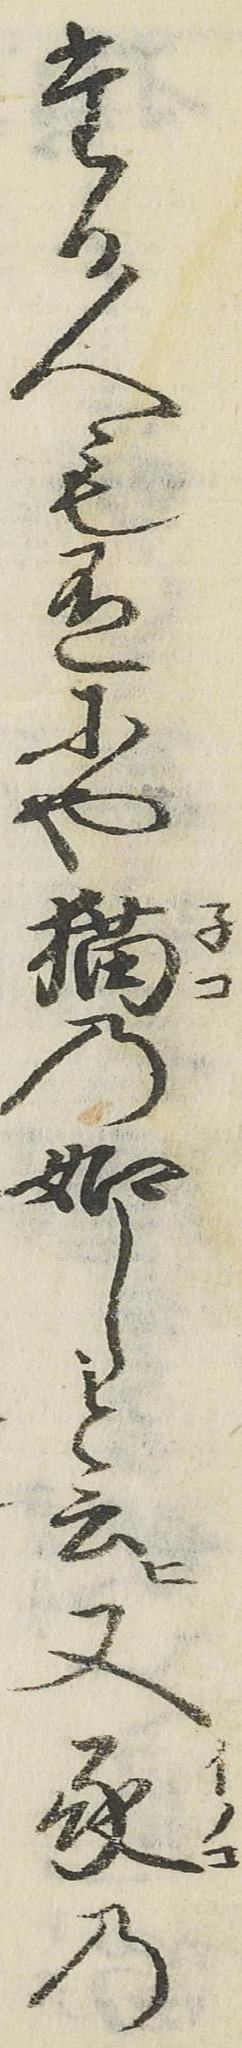たる人も有にや猫の如しと云ひ又豕の
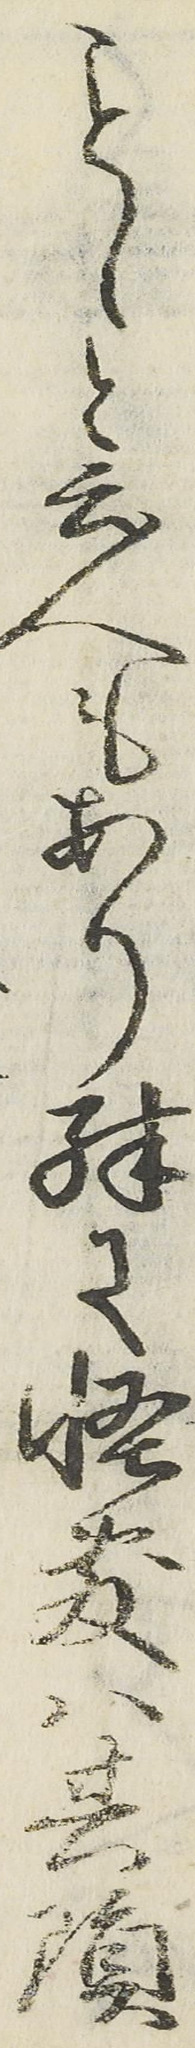ことしと云人もあり殊に怪敷は其隕
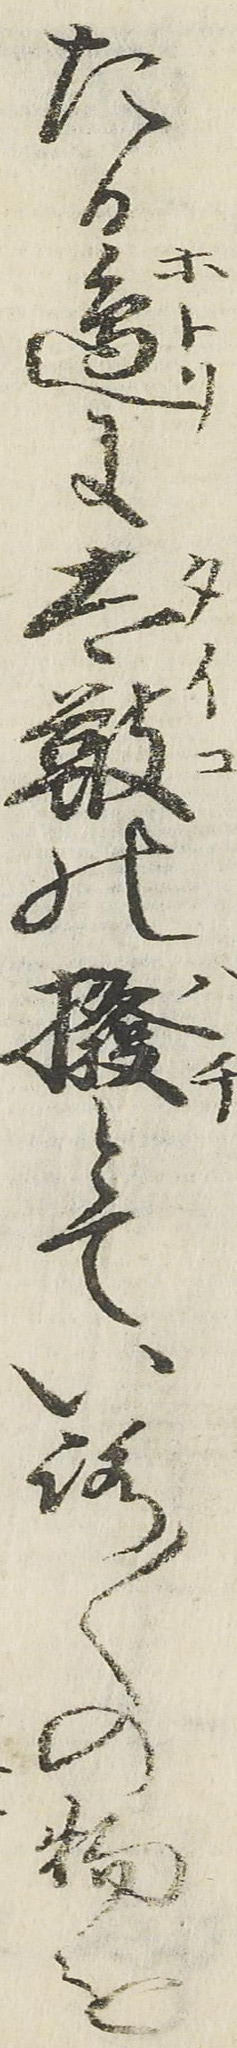たる辺に太鼓の撥とていろ〳〵の物を
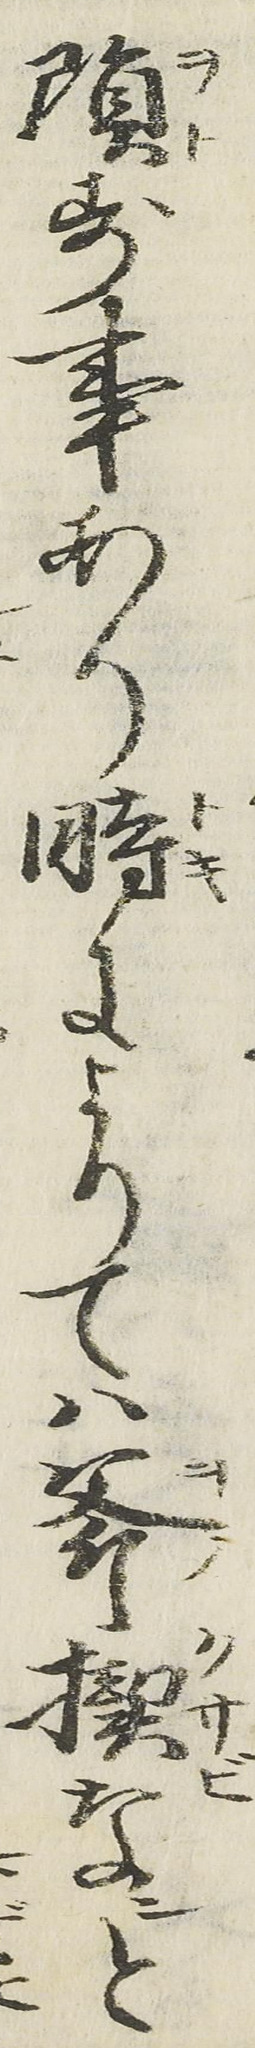隕す事あり時によりては斧楔なにと
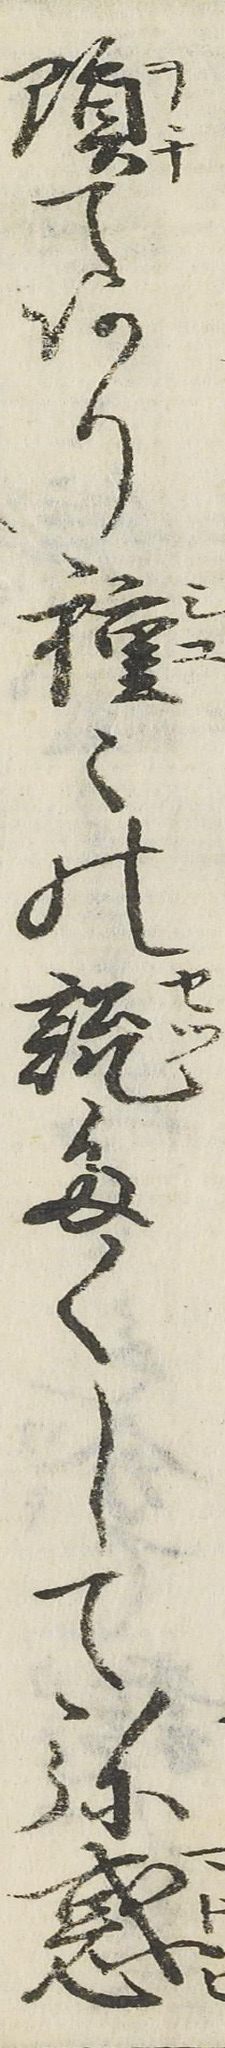隕てあり種々の説多くして弥惑
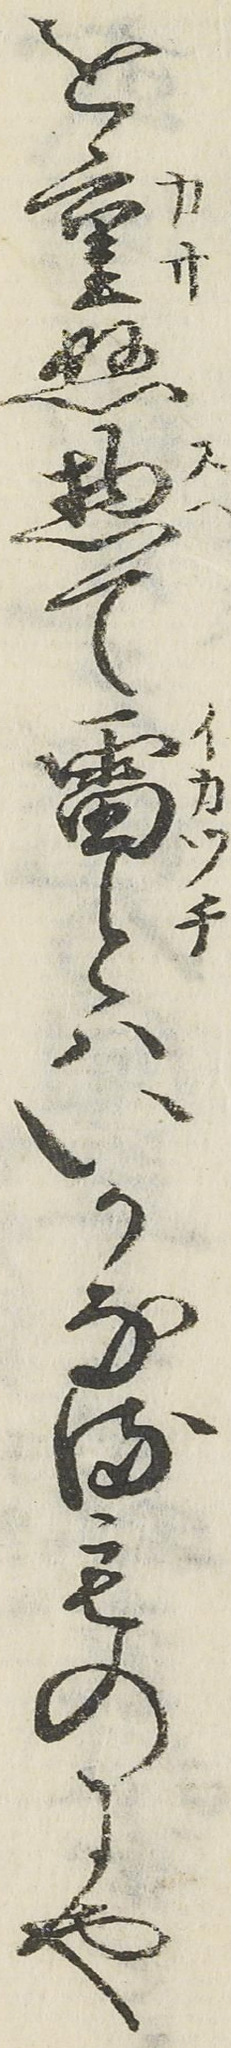を重ぬ惣て雷とはいかなるものにや
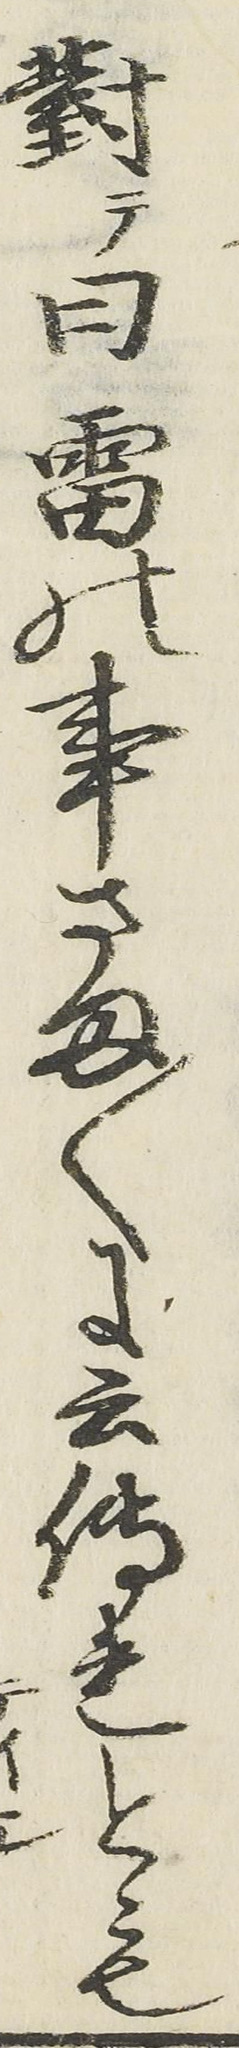対曰雷の事さま〳〵に云伝れとも
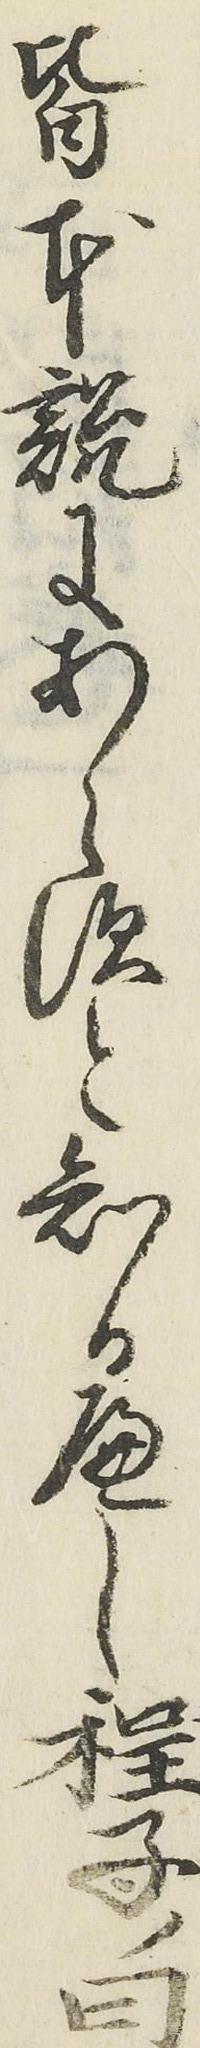皆本説にあらすと知るべし程子の曰
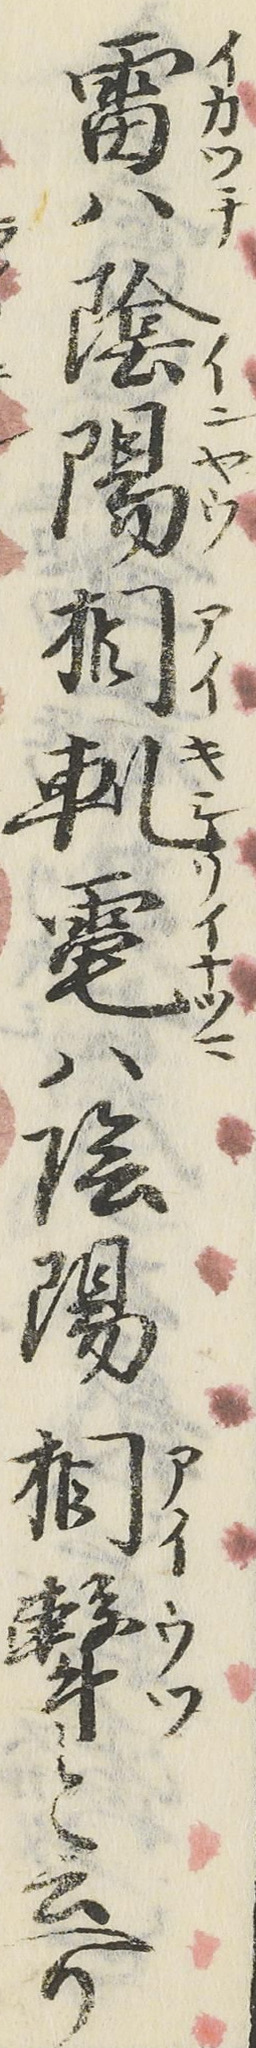雷は陰陽相軋電は陰陽相撃と云へり
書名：天地或問珍　天
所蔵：東京大学地震研究所図書室 Earthquake Research Institute Library, The University of Tokyo, JAPAN
